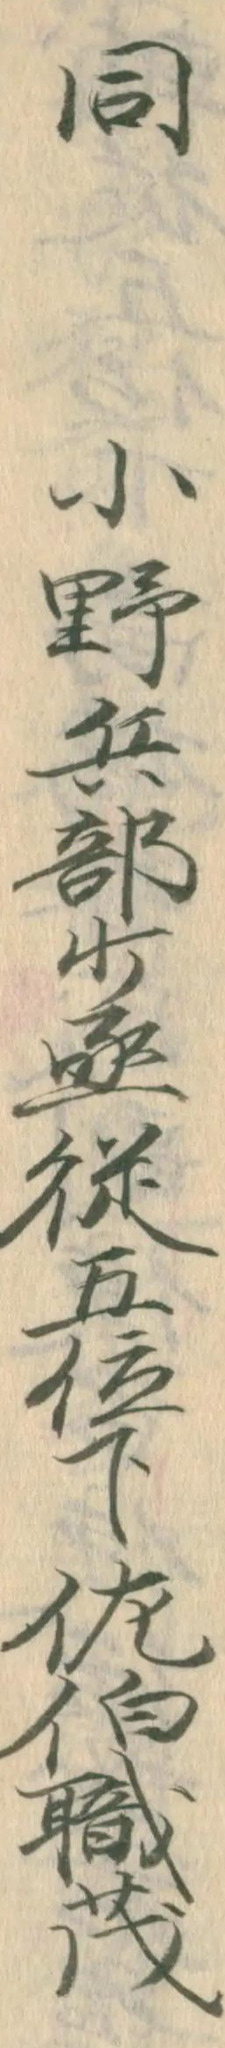同小野兵部少丞従五位下佐伯職茂
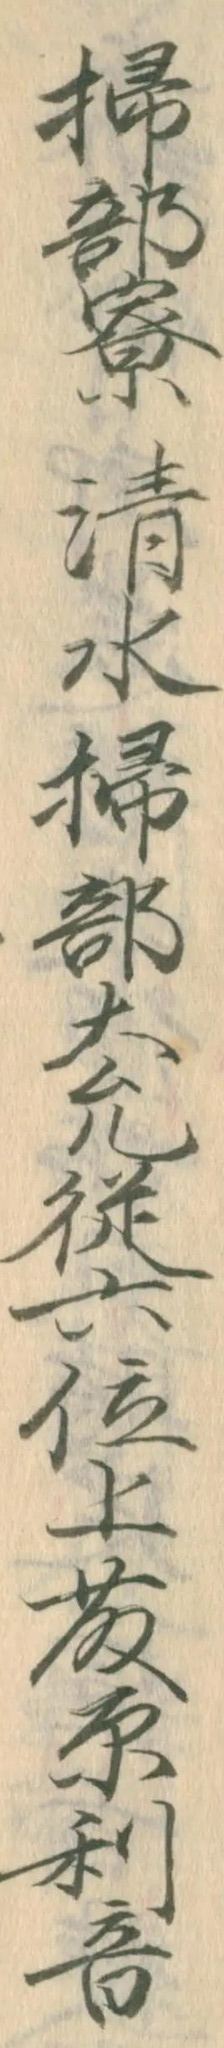掃部寮清水掃部大允従六位上藤原利音
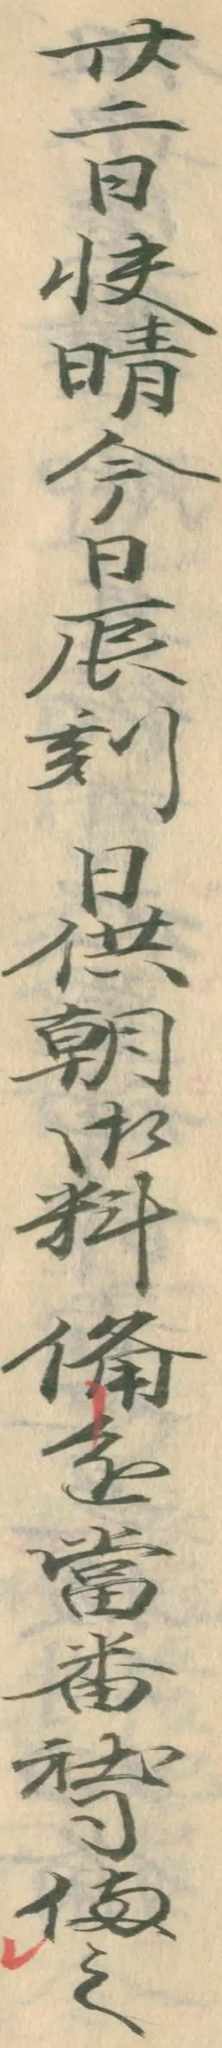廿二日快晴今日辰刻日供朝御料備-進当番社司備之

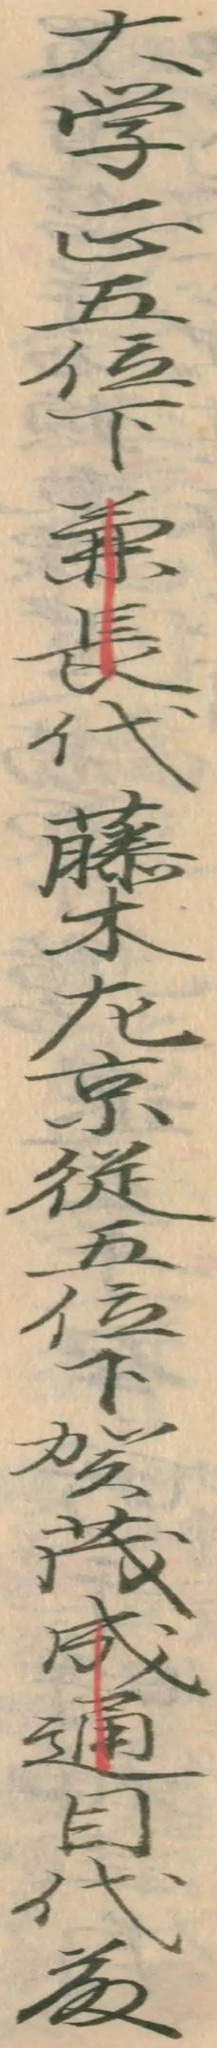大学正五位下兼長代藤木左京従五位下賀茂成通目代藤
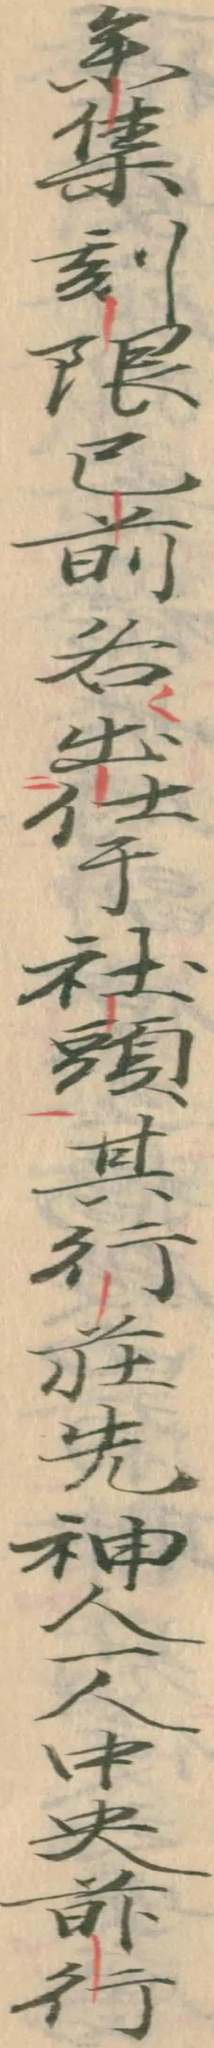参-集刻-限已-前各出-仕于社-頭其行-荘先神人一人中央前-行

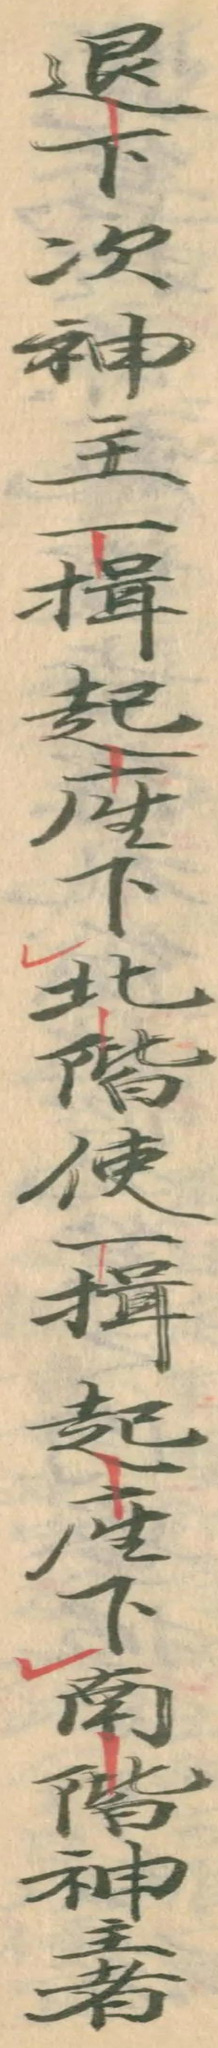退-下次神主一-揖起-座下北-階使一揖起-座下南-階神主者
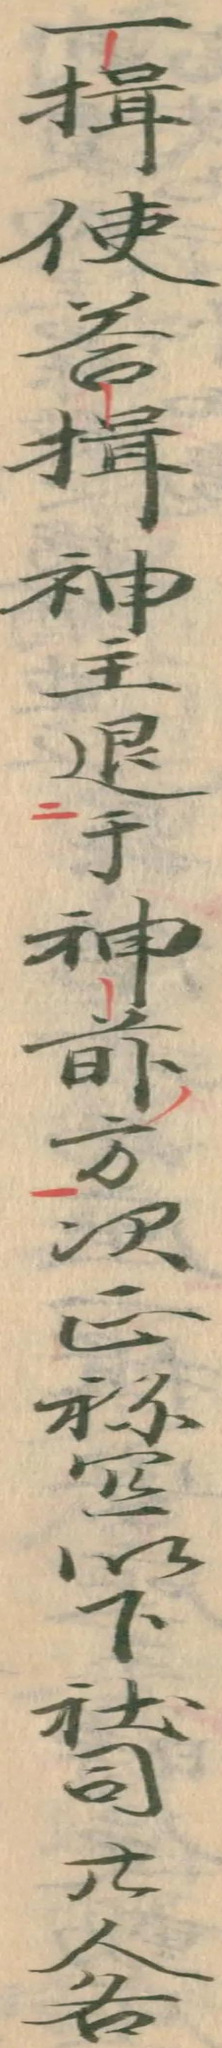一-揖使答-揖神主退于神-前方次正祢宜以下社司廿人各
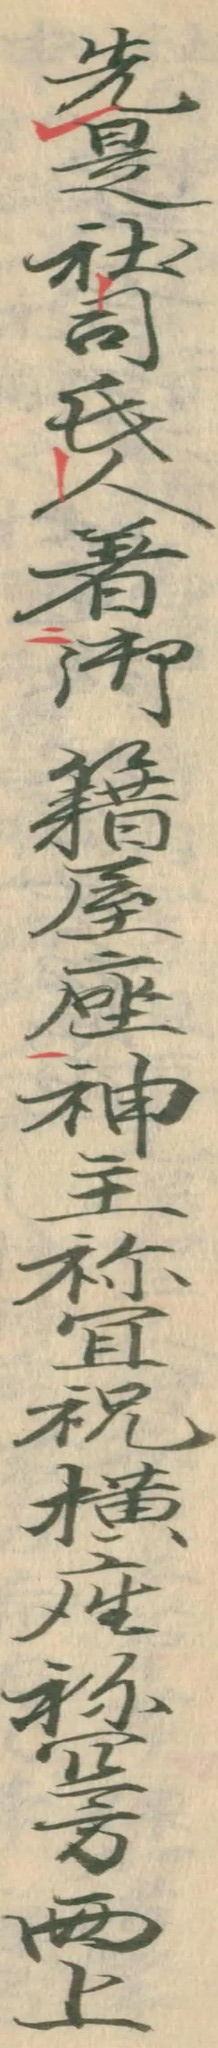先是社-司氏着御籍屋座神主祢宜祝横座祢宜方西上

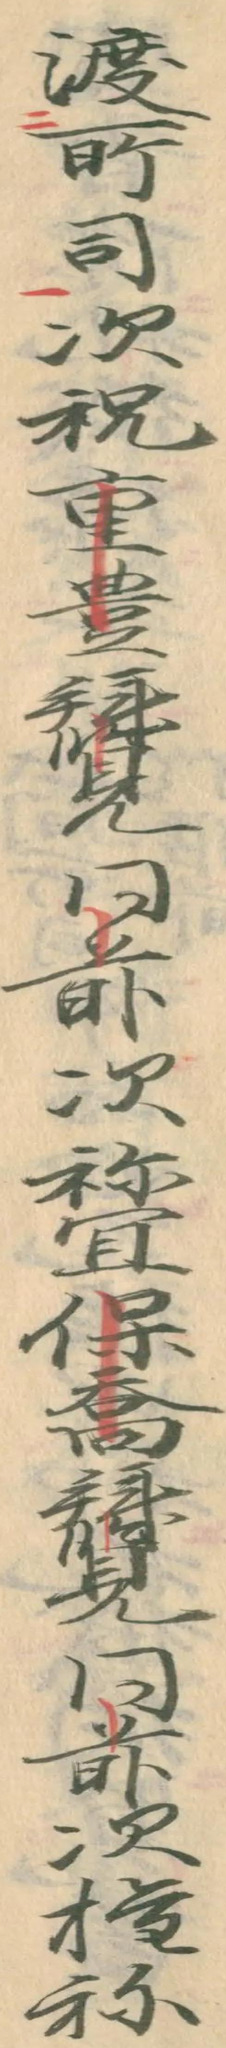渡所司次祝重豊拝-覧同-前次祢宜保喬拝-覧同-前次権祢
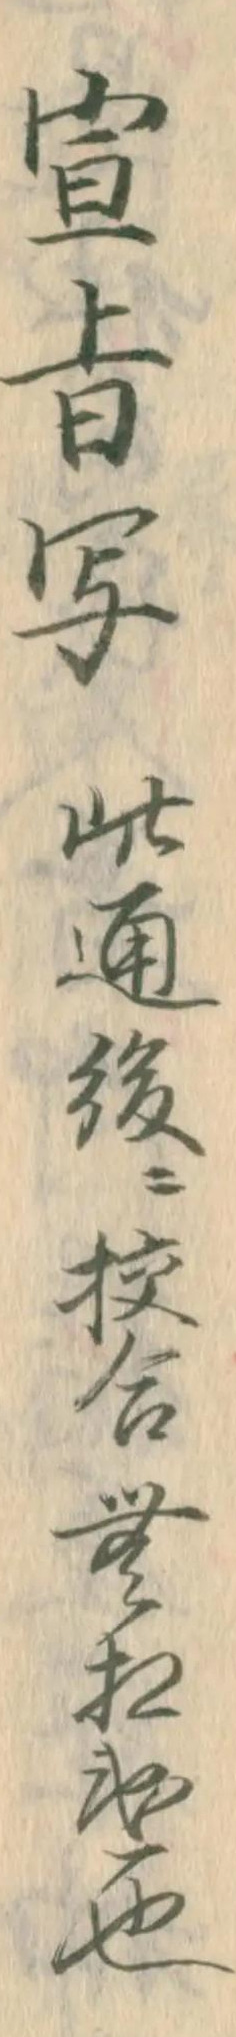宣旨写此通後ニ校合無相成也
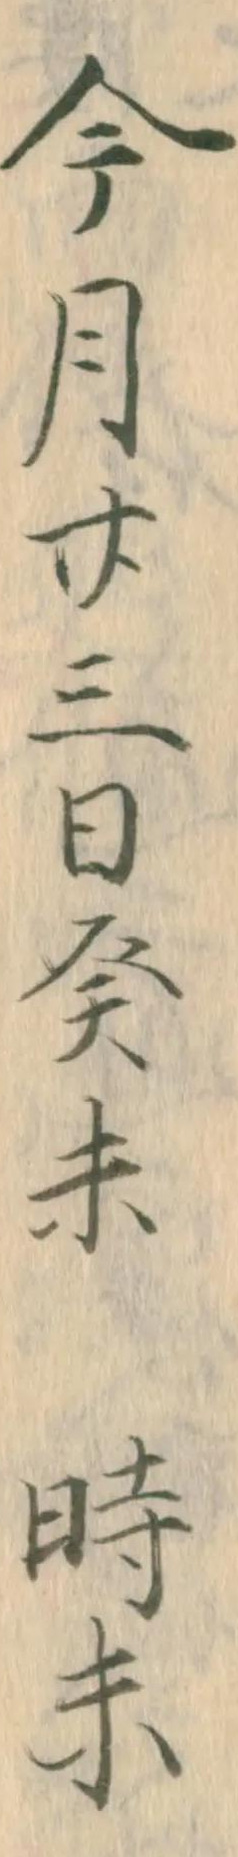今月廿三日癸未時未
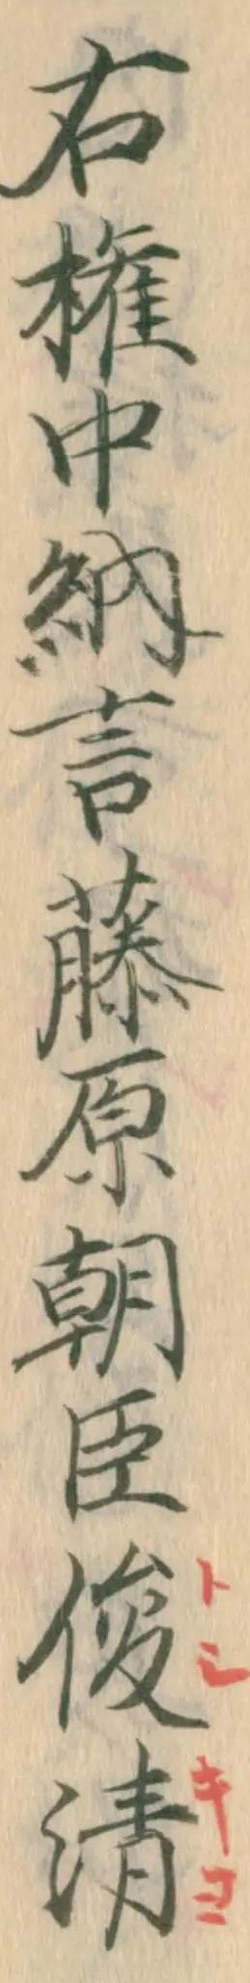右権中納言藤原朝臣俊清
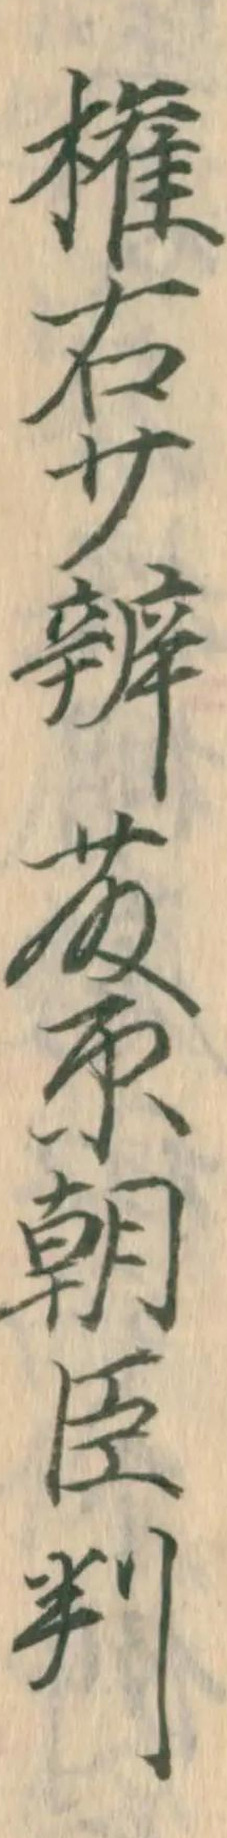權右少弁藤原朝臣判
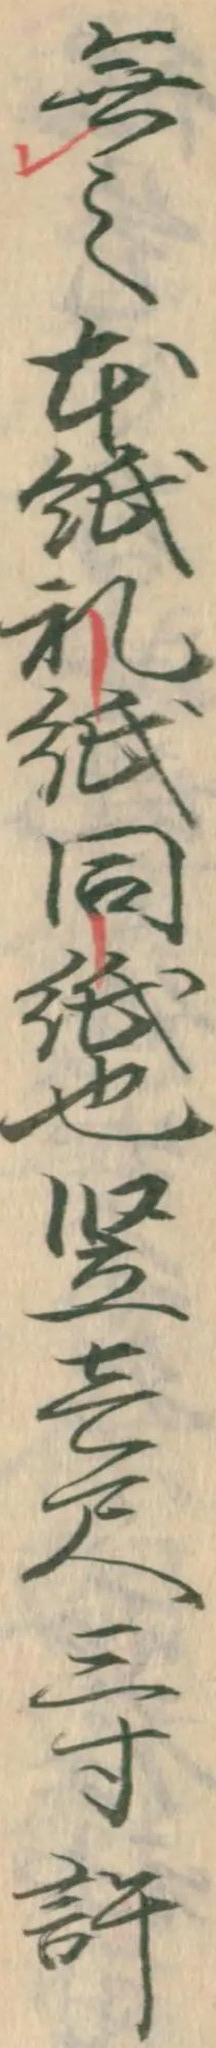無之本紙礼-紙同-紙也竪壱尺三寸許
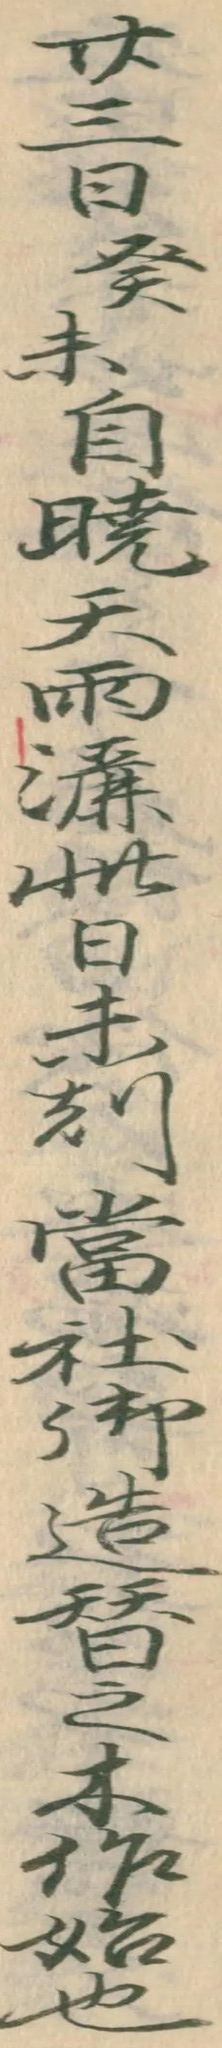廿三日癸未自暁天雨_濂此日未刻当社御造替之木作始也

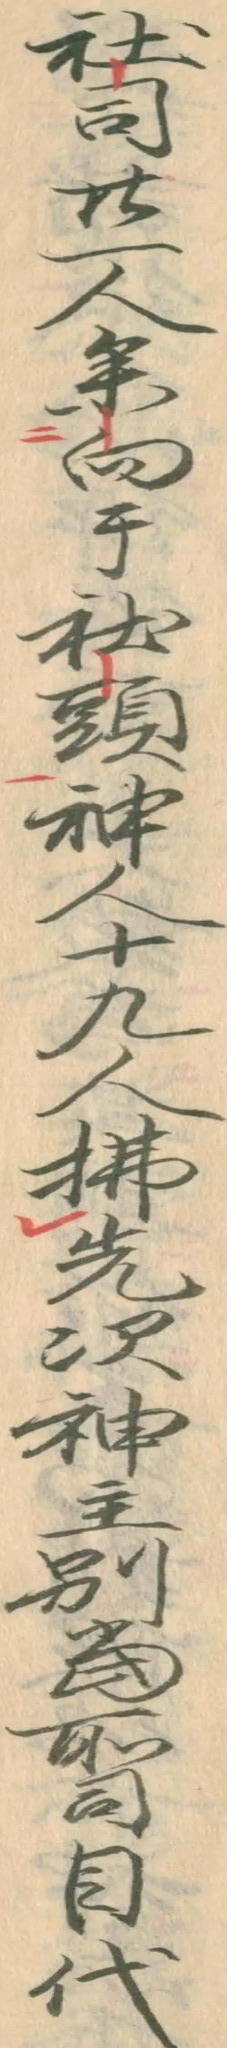社-司廿一人参-向于社-頭神人十九人払先次神主別当所司目代
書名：賀茂社記録. 第15冊
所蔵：国立国会図書館 National Diet Library, JAPAN
